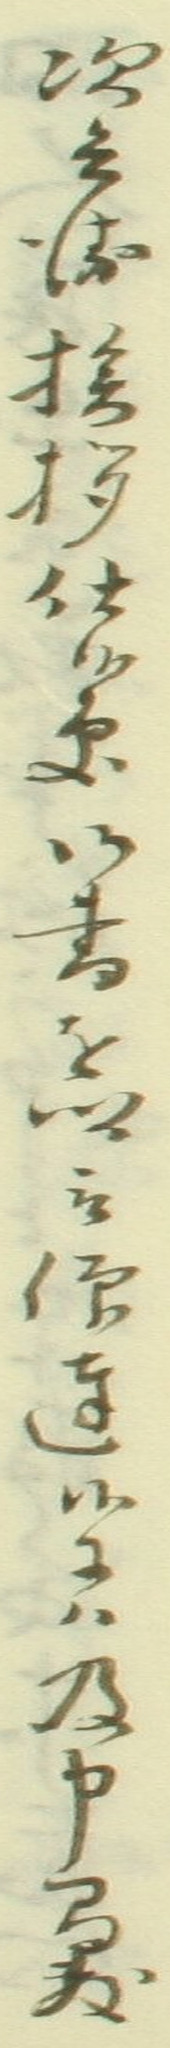次兵衛挨拶仕候処御書を以被仰達候には及申間敷
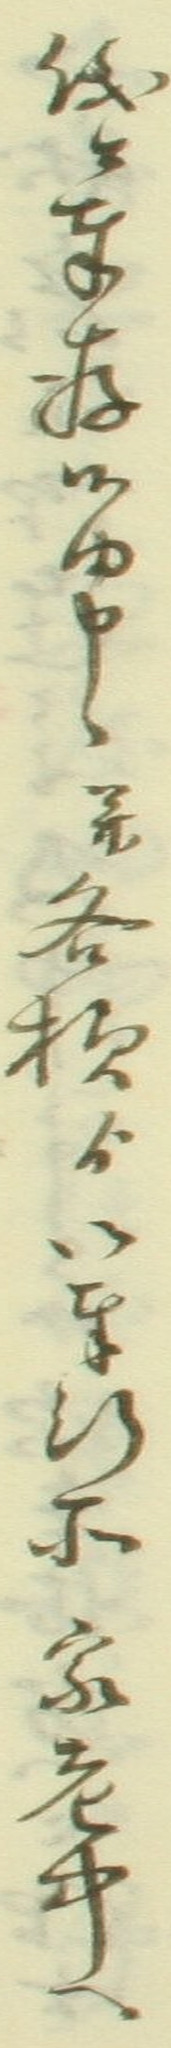儀と奉存候由申候并各様ゟ御奉行所家老中へ

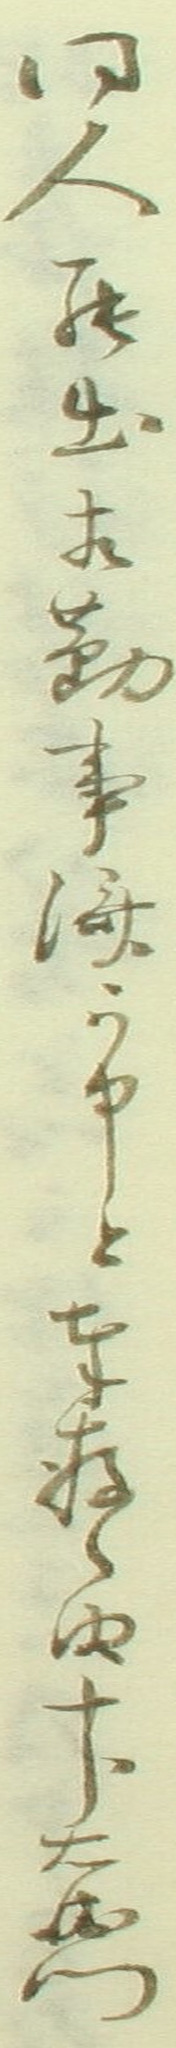同人罷出相勤事済可申と奉存候由十郎右衛門
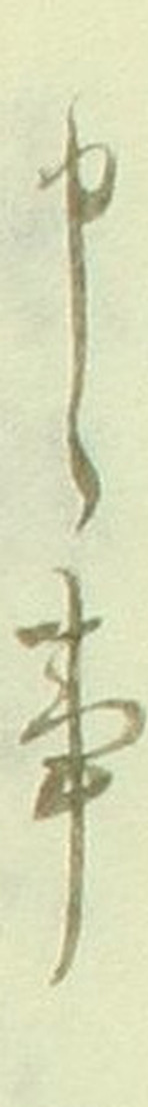申候事
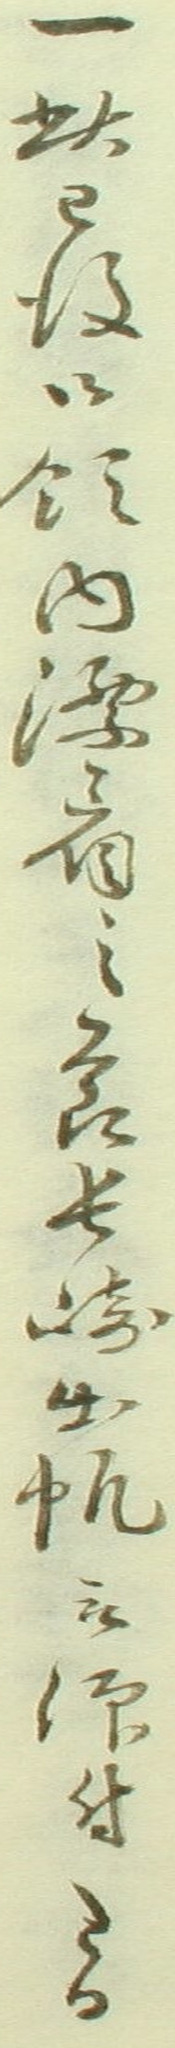一此已後御領内漂着之節長崎出帆被仰付たる
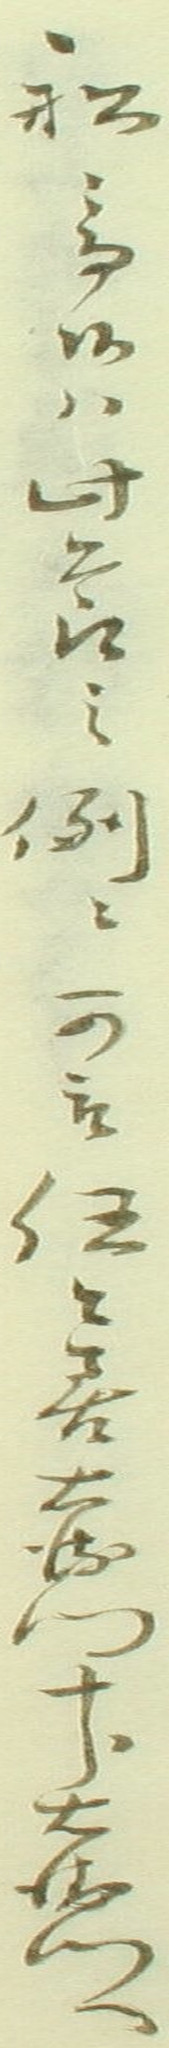船に而候は此節之例可被任と善右衛門十郎右衛門へ
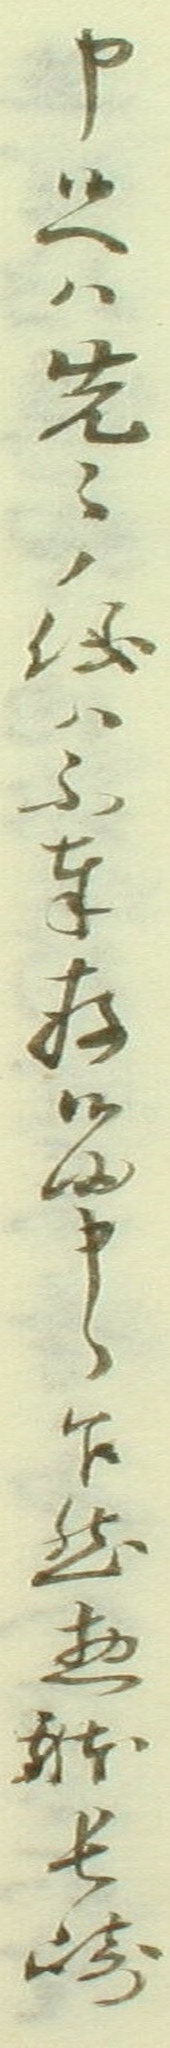申候へは先々ノ儀は不奉存候由申候乍然惣躰長崎
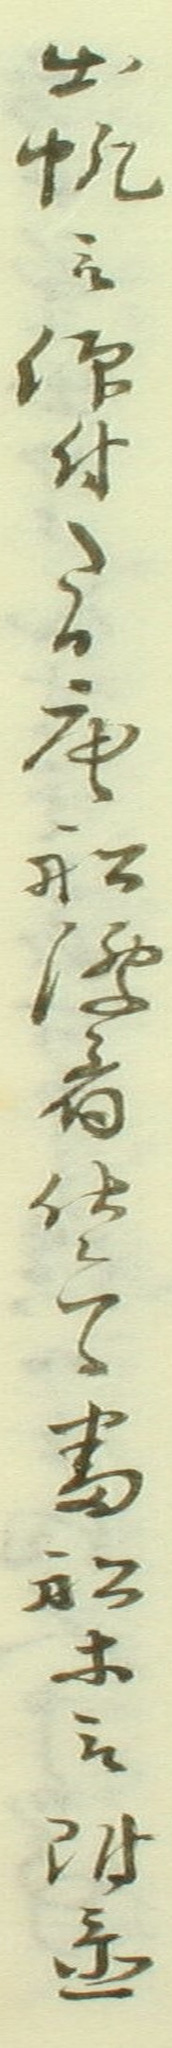出帆被仰付たる唐船漂着仕候はゝ番船等被附置
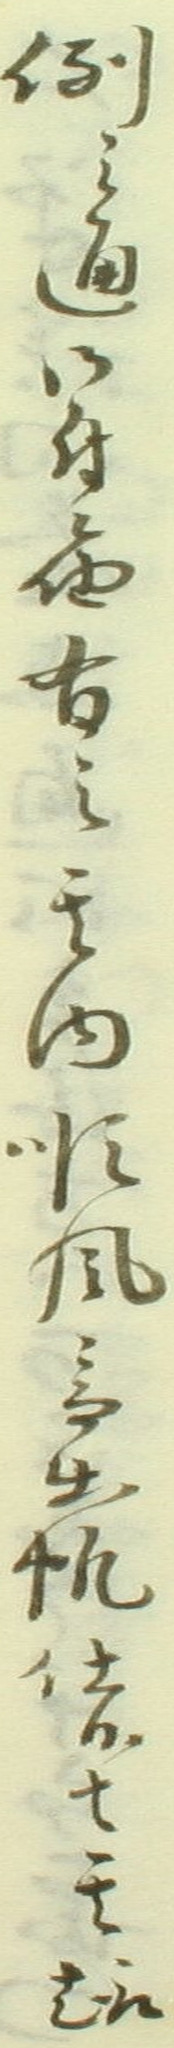例之通御付届有之其内順風に而出帆仕候は其趣
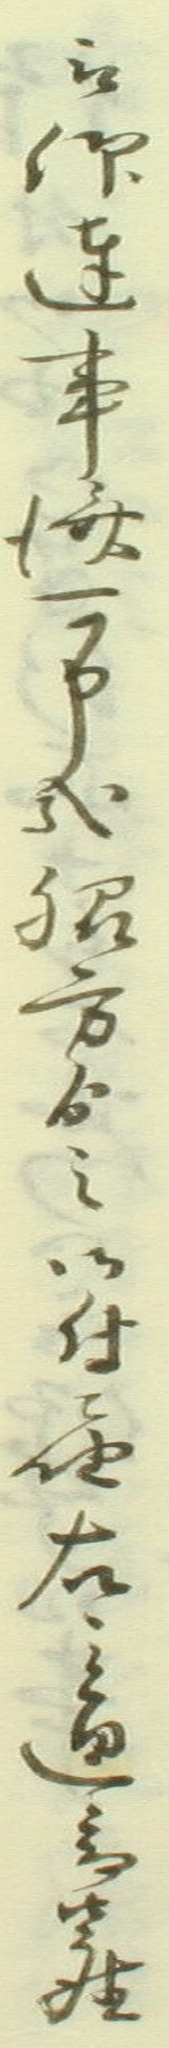被仰達事済可申哉脇方ゟ之御付届右之通に而御座
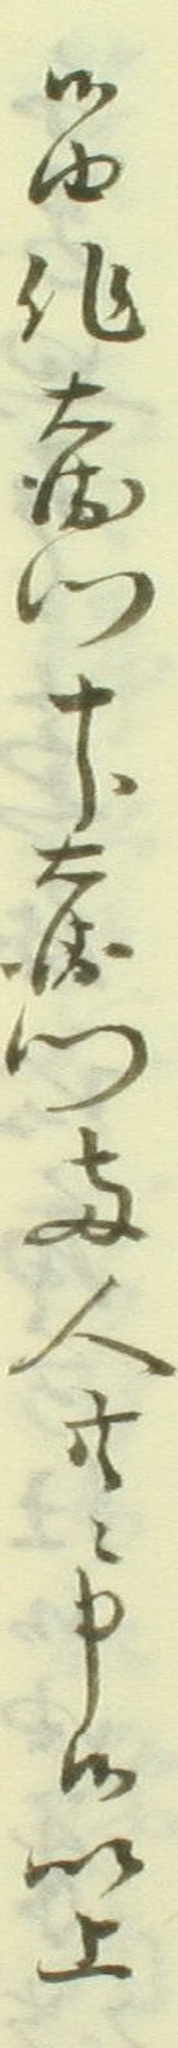候由作右衛門十郎右衛門両人共に申候以上
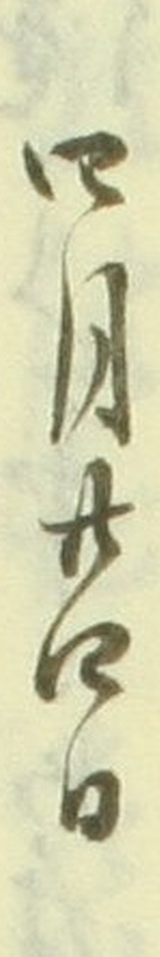四月廿四日
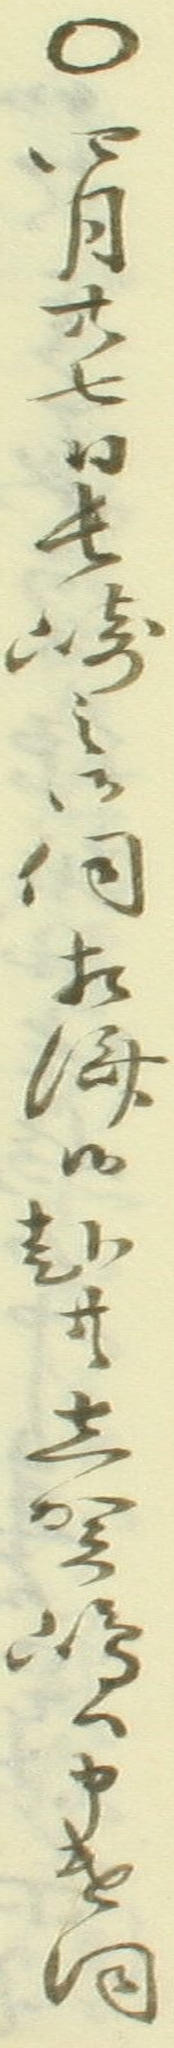〇四月廿七日長崎之御伺相済候趣共志賀島へ申遣同
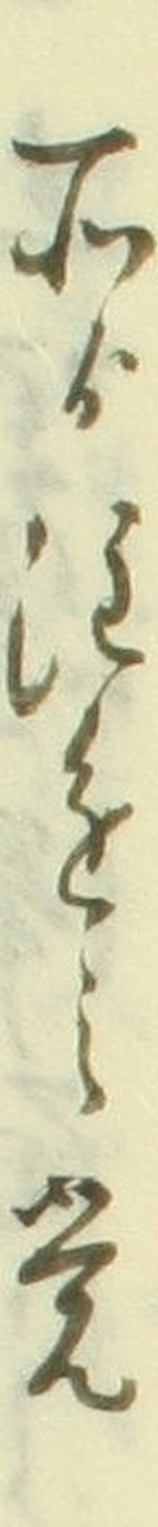所ゟ注進之覚
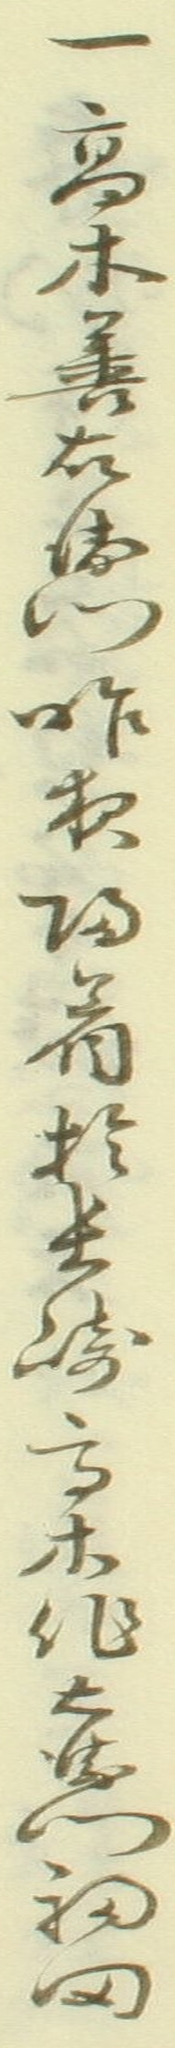一高木善右衛門昨夜帰着於長崎高木作右衛門福田
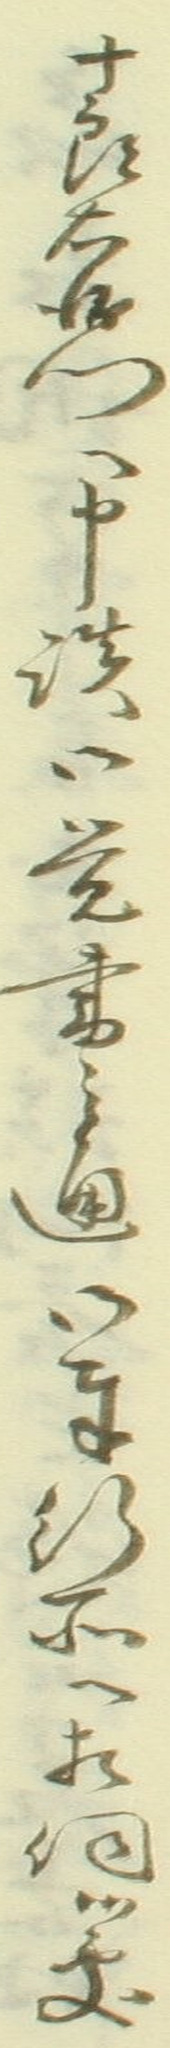十郎右衛門へ申談御覚書之通御奉行所へ相伺候処
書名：異国船漂着記
